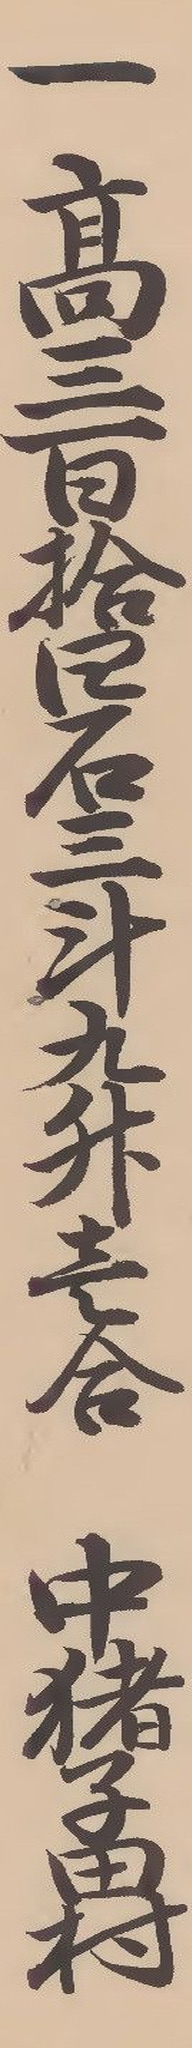一高三百拾四石三斗九升壱合中猪子田村

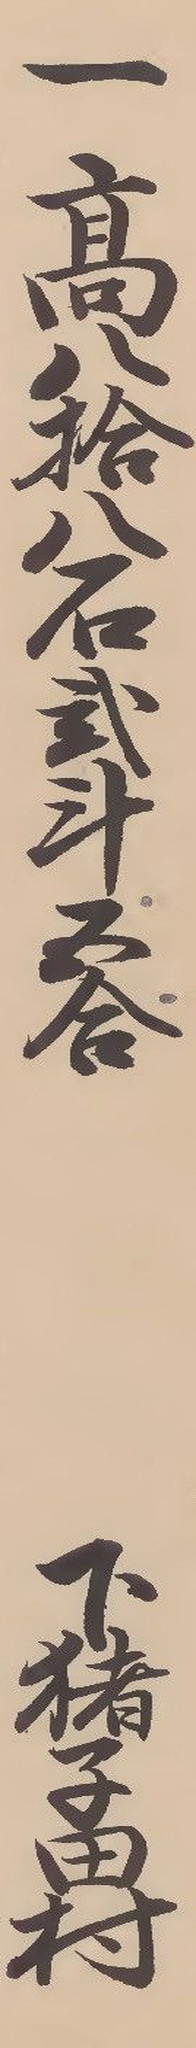一高八拾八石弐斗五合下猪子田村
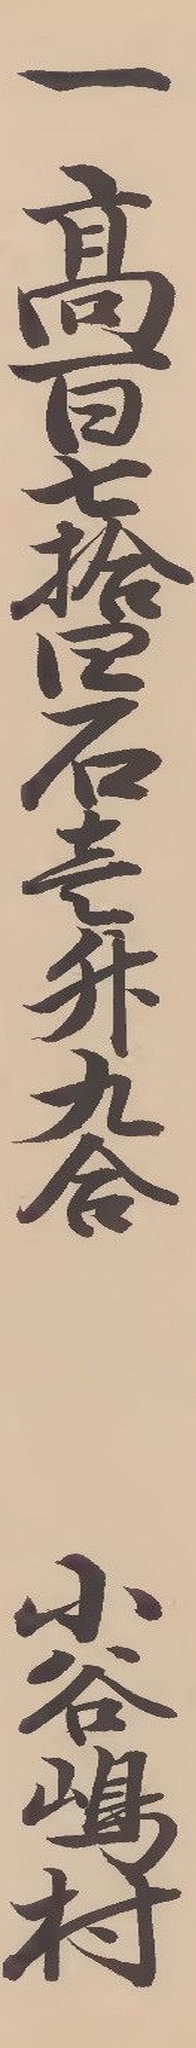一高百七拾四石壱升九合小谷島村
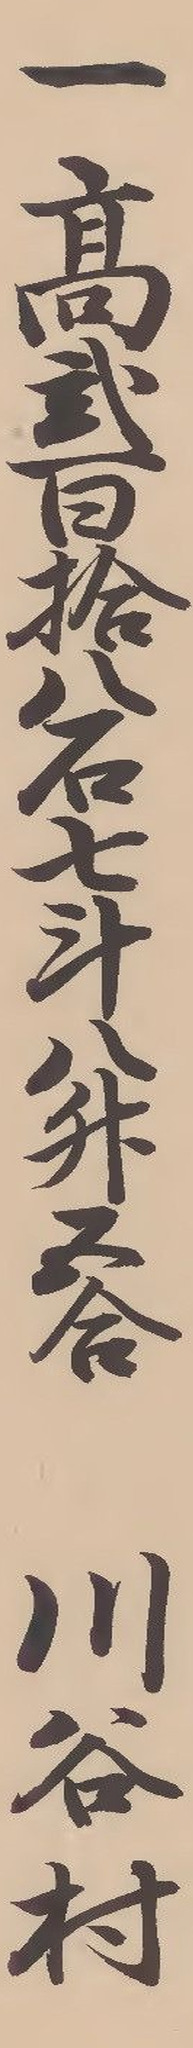一高弐百拾八石七斗八升五合川谷村
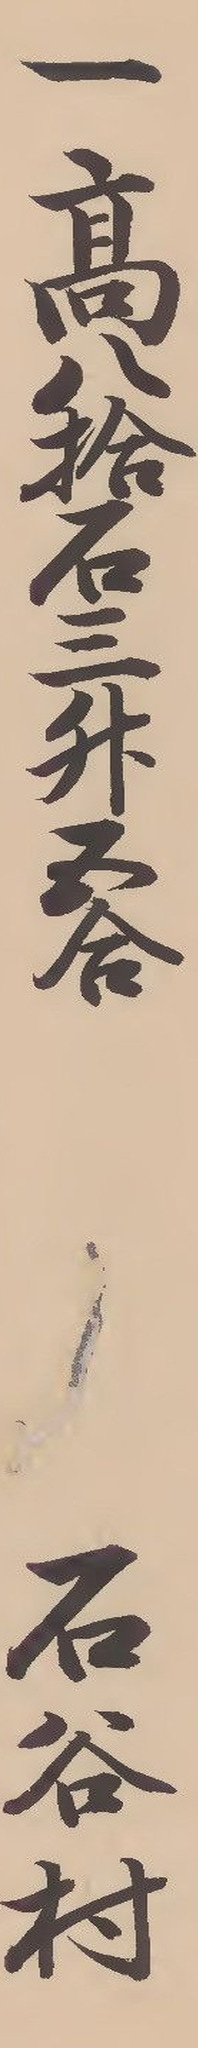一高八拾石三升五合石谷村
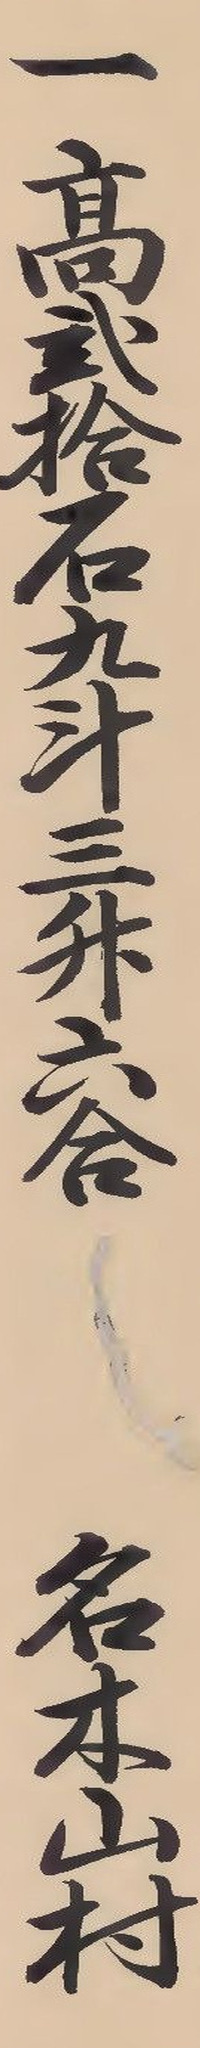一高弐拾石九斗三升六合名木山村
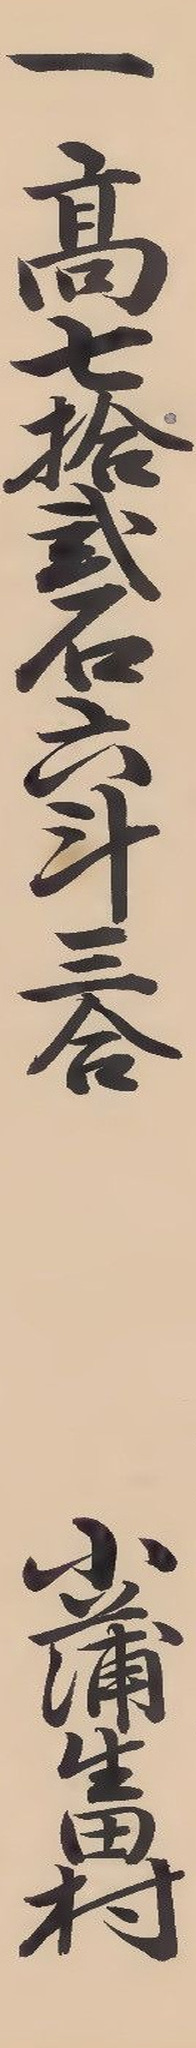一高七拾弐石六斗三合小蒲生田村
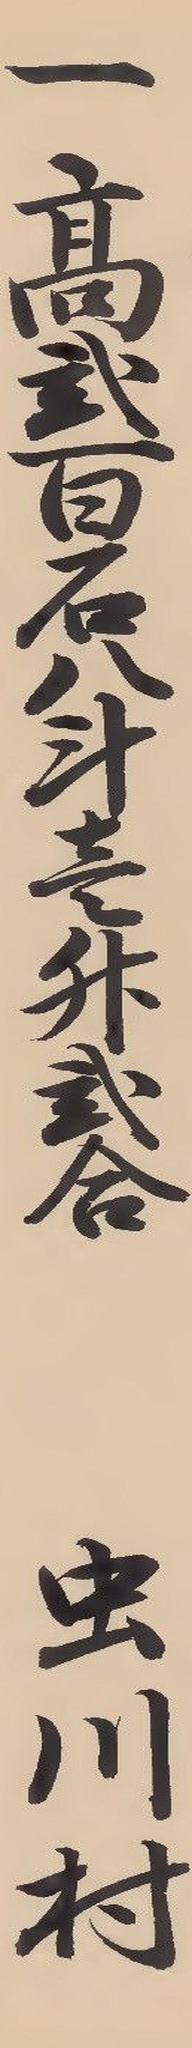一高弐百石八斗壱升弐合虫川村
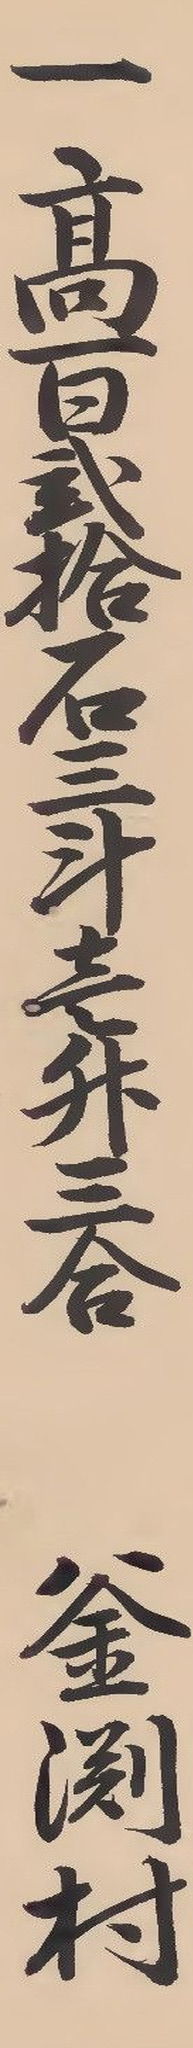一高百弐拾石三斗壱升三合釜淵村

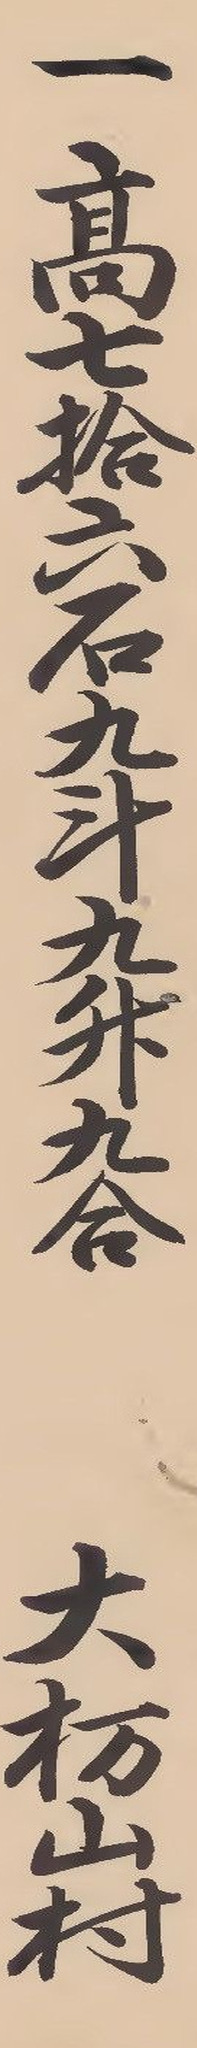一高七拾六石九斗九升九合大栃山村
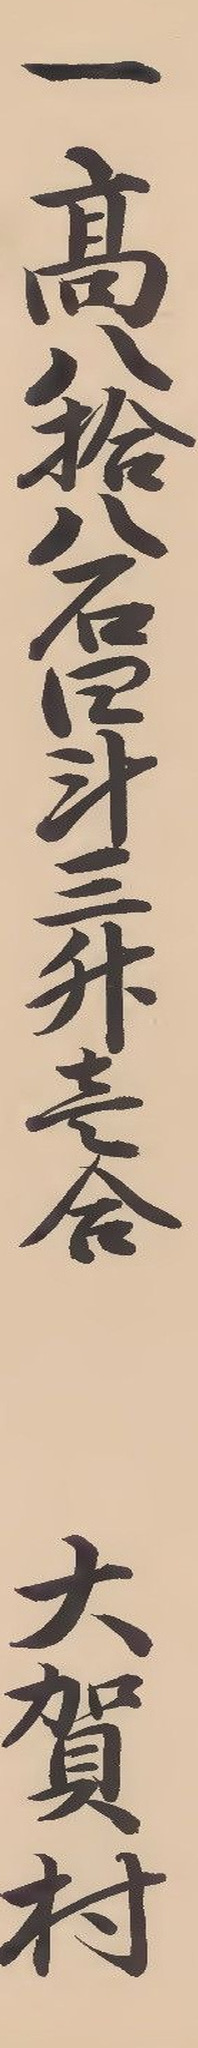一高八拾八石四斗三升壱合大賀村
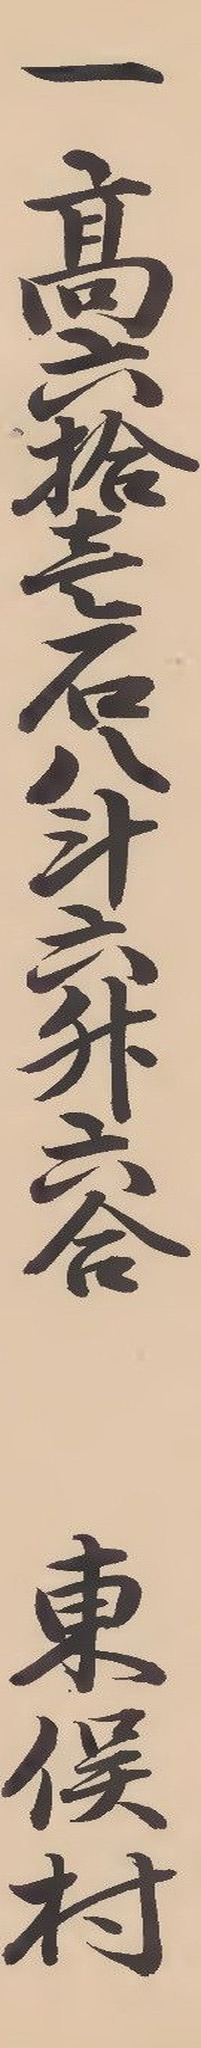一高六拾壱石八斗六升六合東俣村
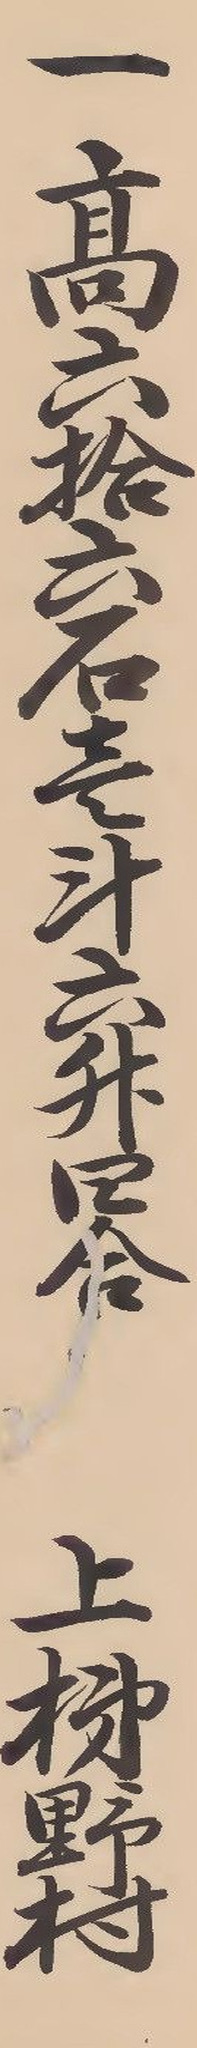一高六拾六石壱斗六升四合上柿野村
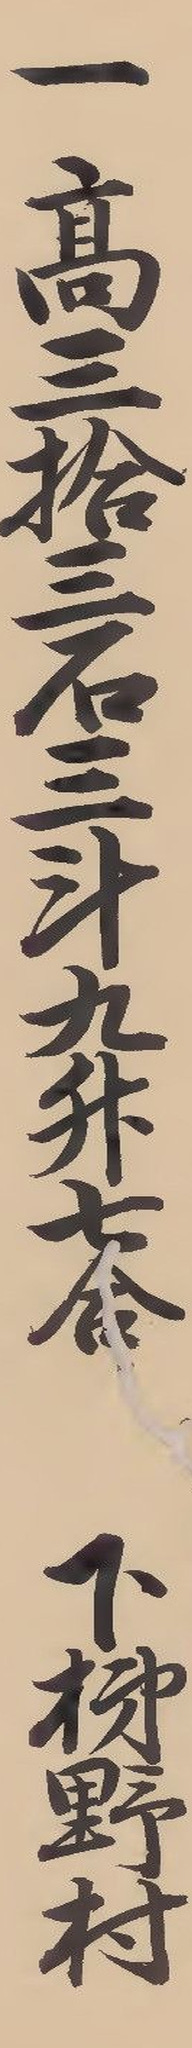一高三拾三石三斗九升七合下柿野村
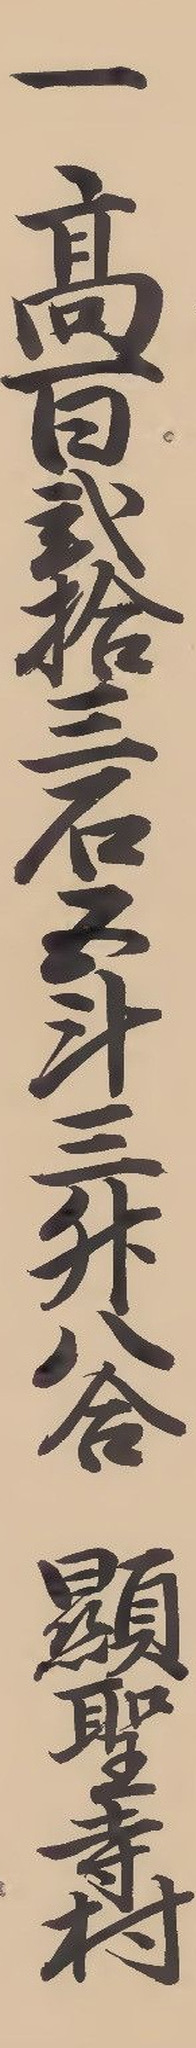一高百弐拾三石五斗三升八合顕聖寺村
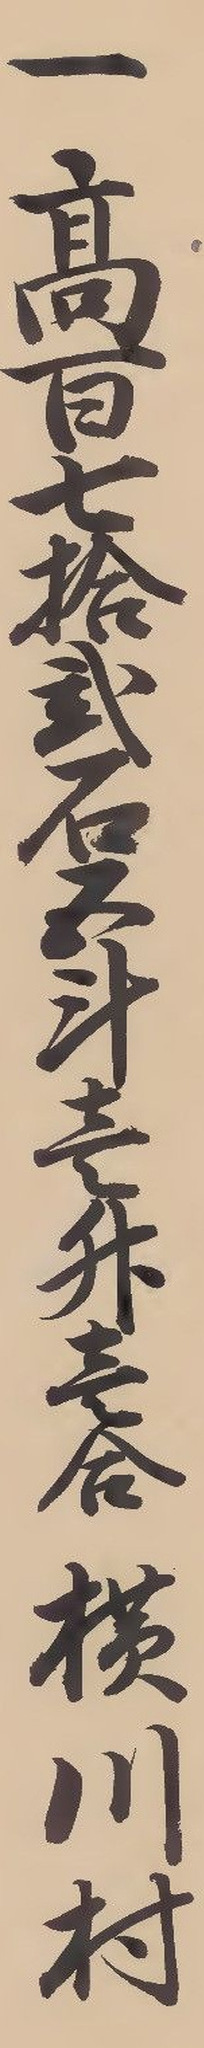一高百七拾弐石五斗壱升壱合横川村
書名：越後国郷帳　上
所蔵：国立公文書館 National Archives of Japan
